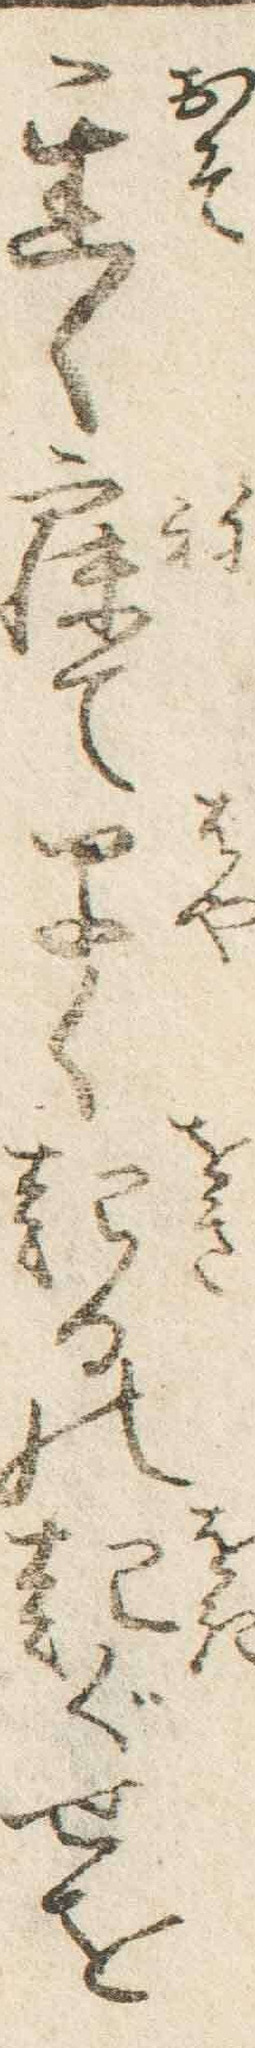遅く寝て早く起るの起ぐせを
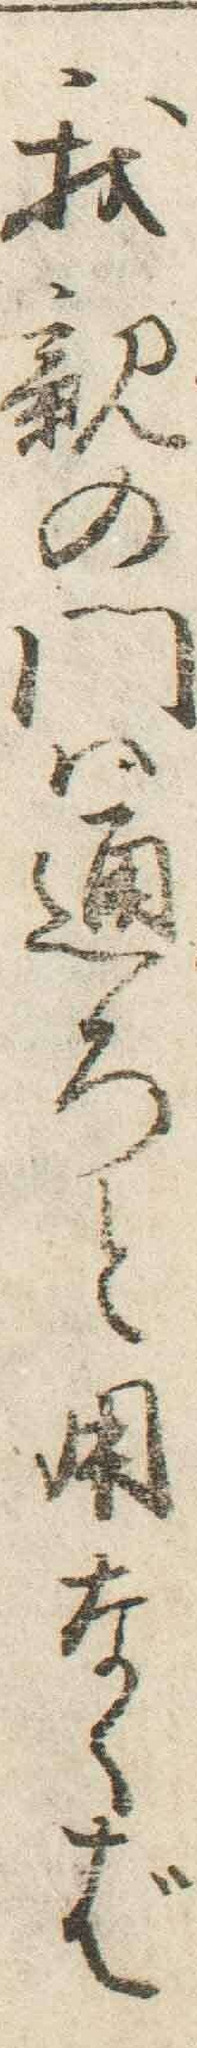我親の門は通ろと用なくば
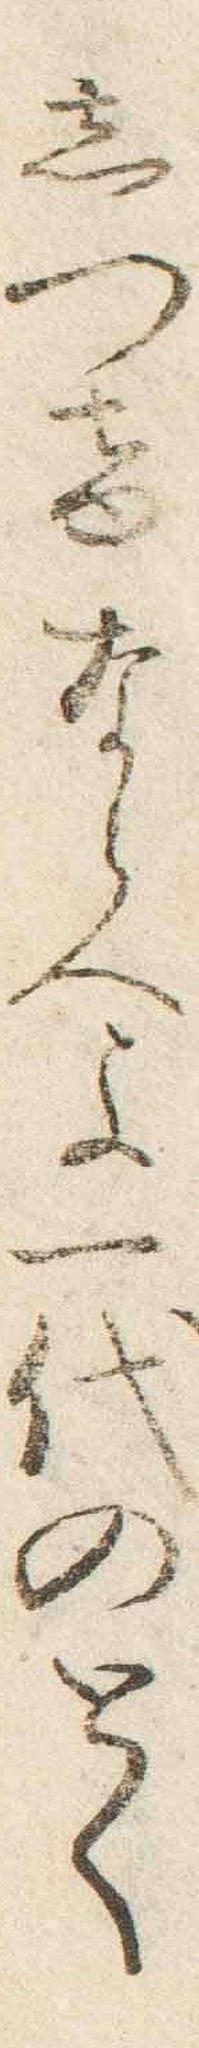しつけならへよ一代のとく
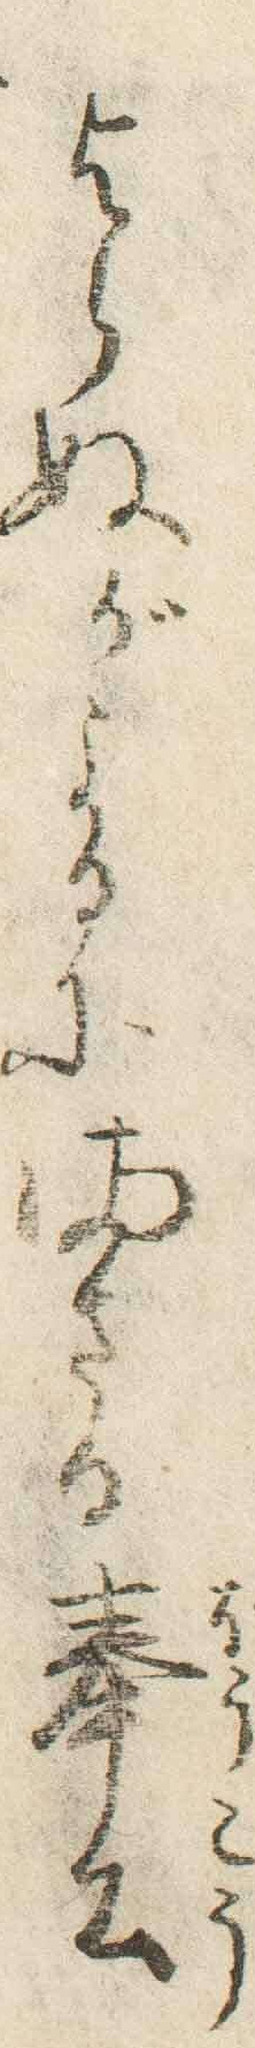よらぬがよるにまさる奉公
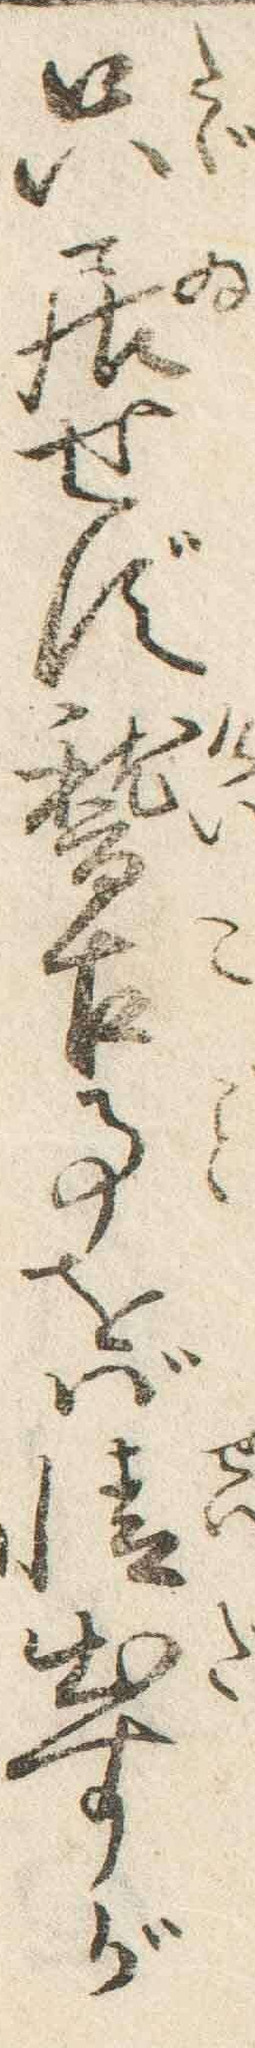只居せず稽古事をば情出すが
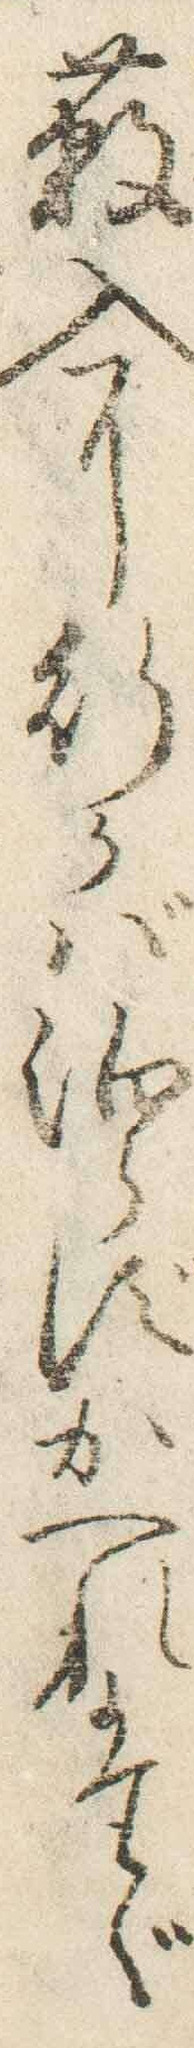薮入に行かば泊らずかへれすぐ
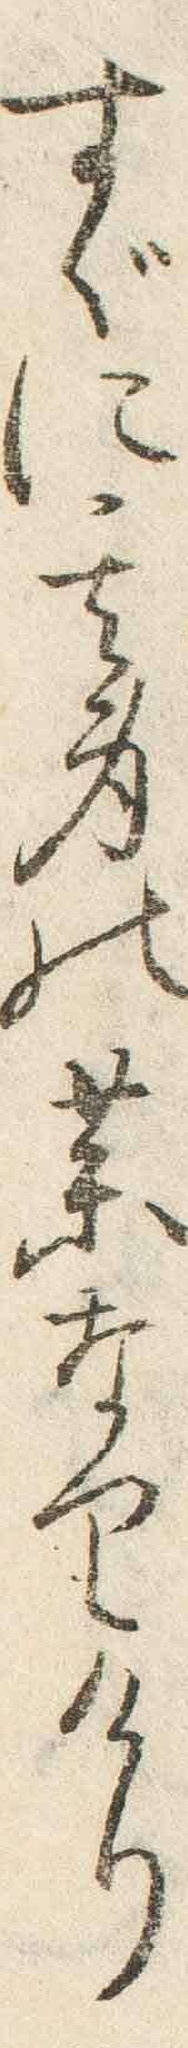すぐに其身の薬なりけり
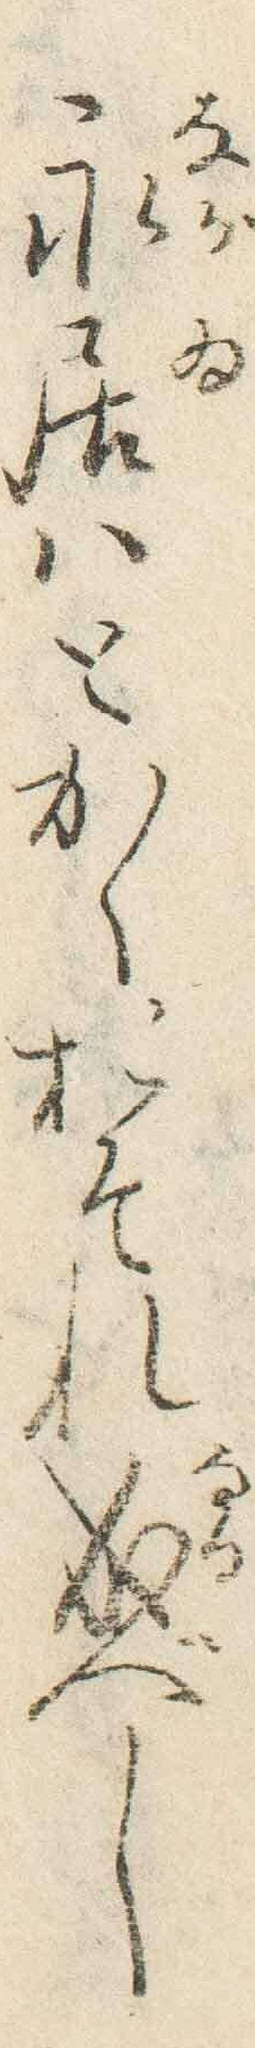永居はとかくおそれ成べし
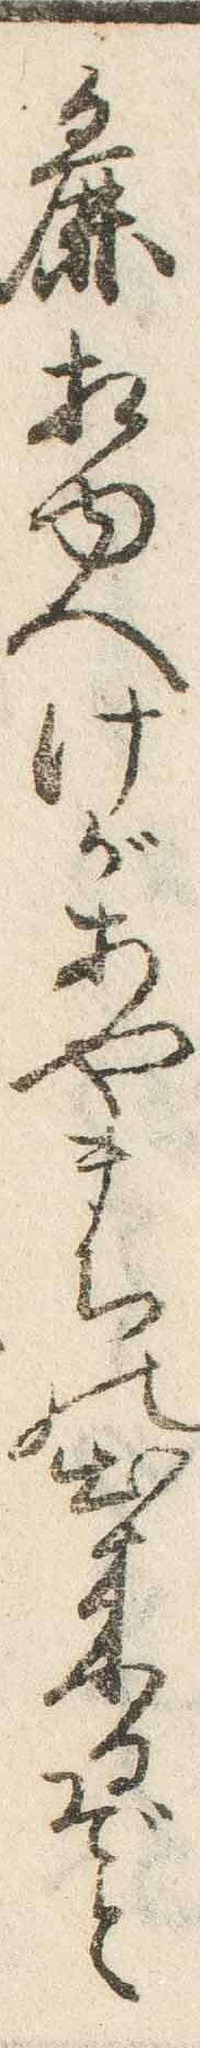麁相ゆへけがあやまちの出来るぞと
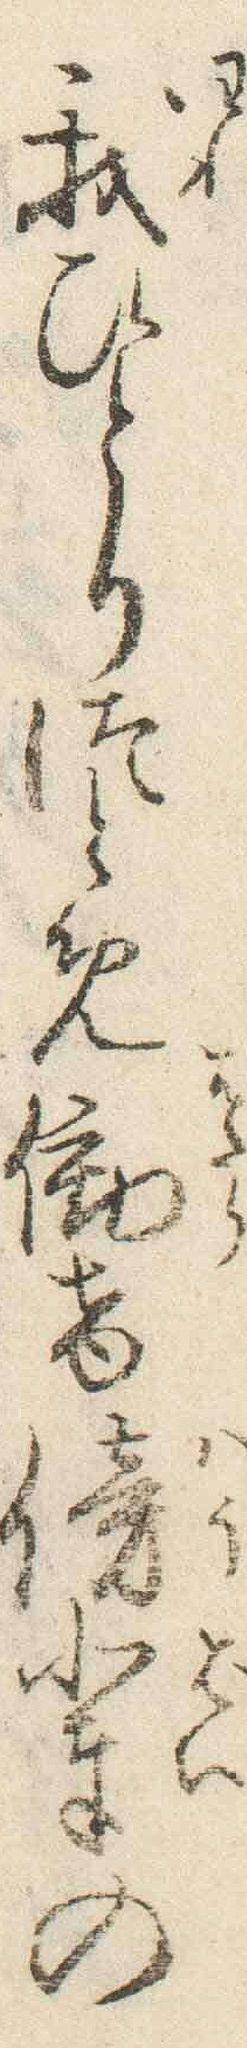我ひとりつとめ働け傍輩の
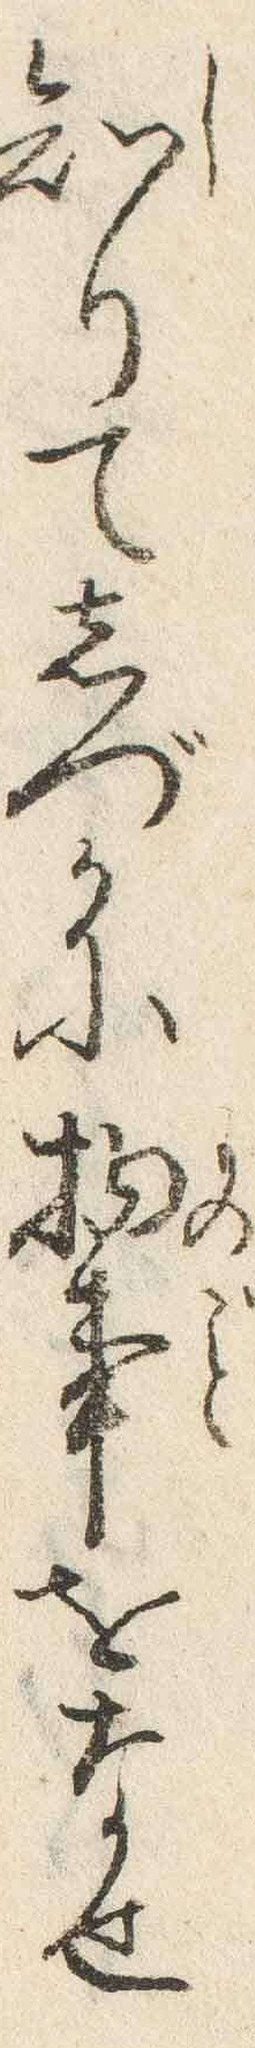知りてしづかに物事をなせ
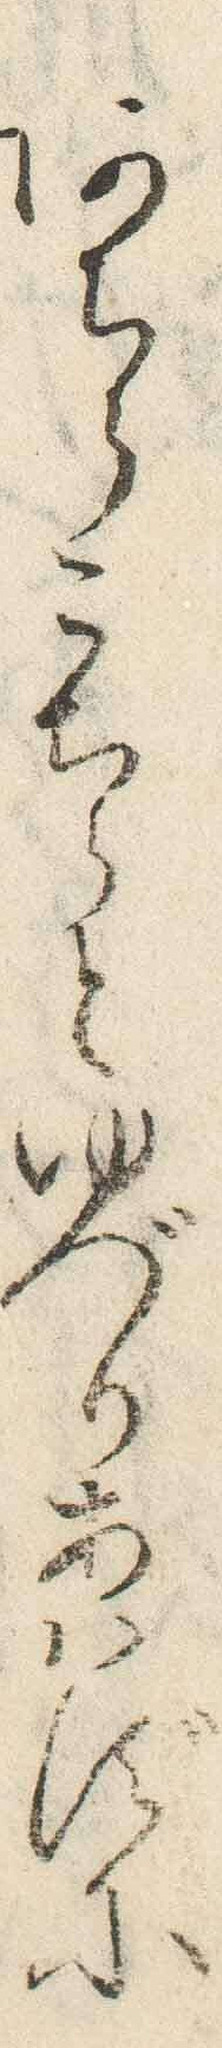あちらこちらとゆづりあはずに
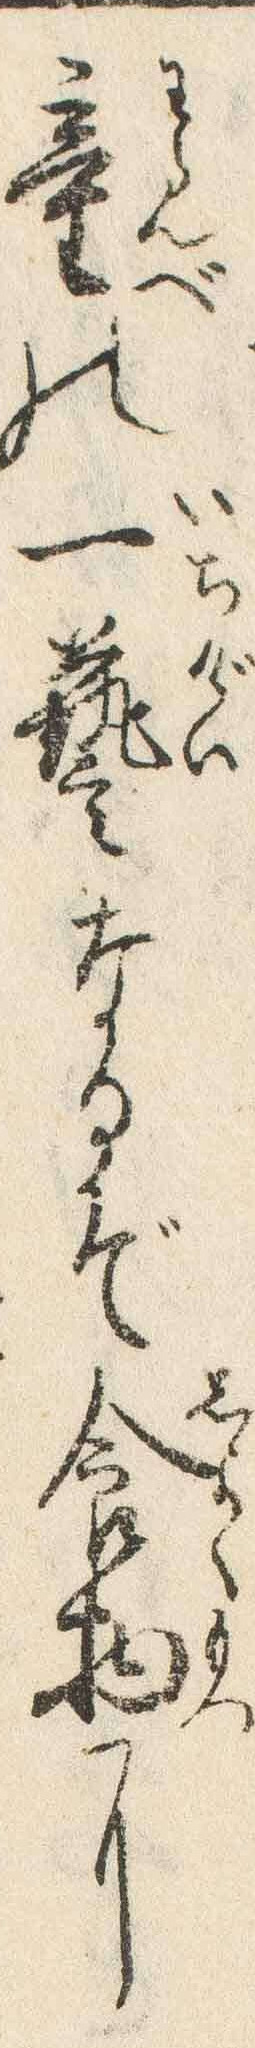童の一芸なるぞ食物に
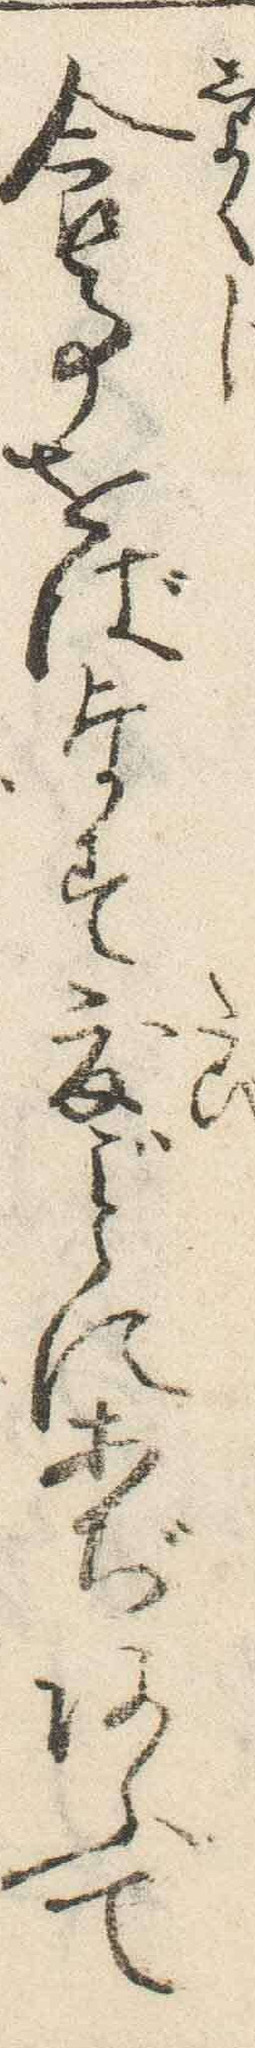食事をばなす度ごとにあぢあふて
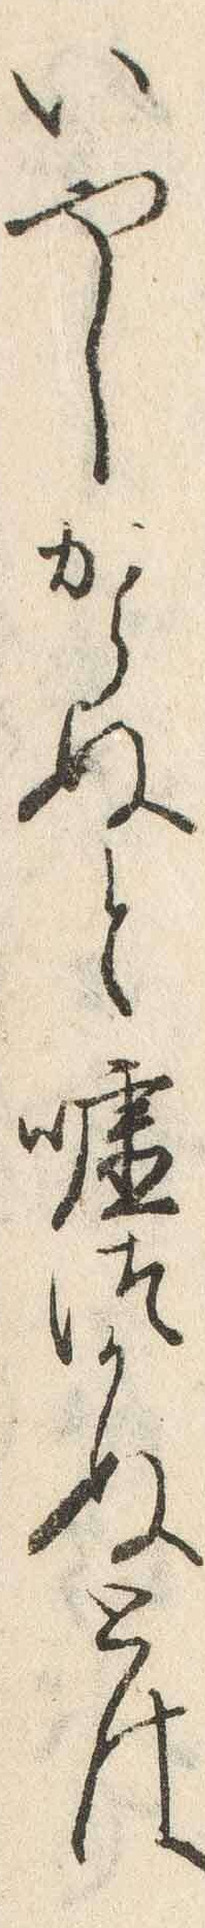いやしからぬと嘘つかぬとは
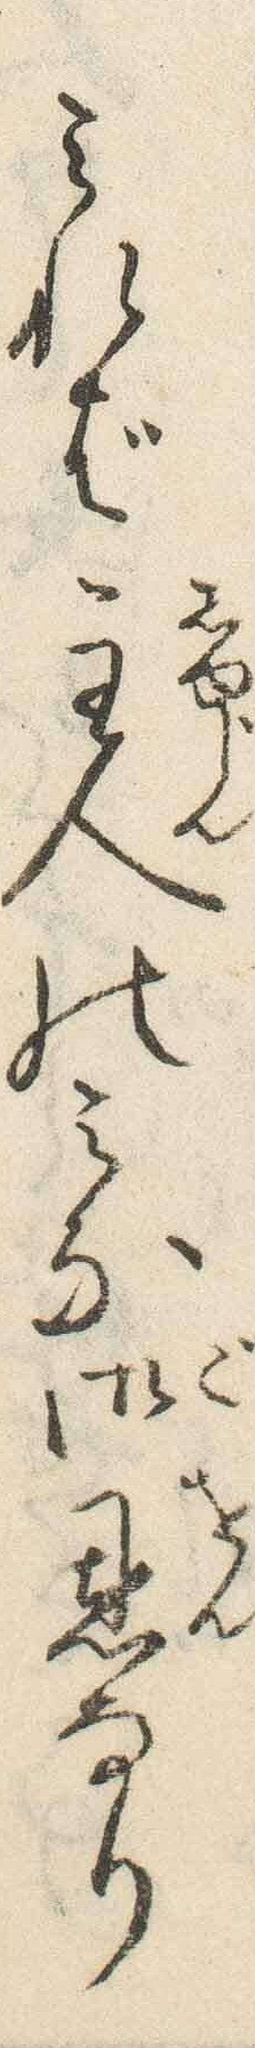みれば主人のみな御恩なり
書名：撫育草
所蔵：東京学芸大学附属図書館 国文学研究資料館
